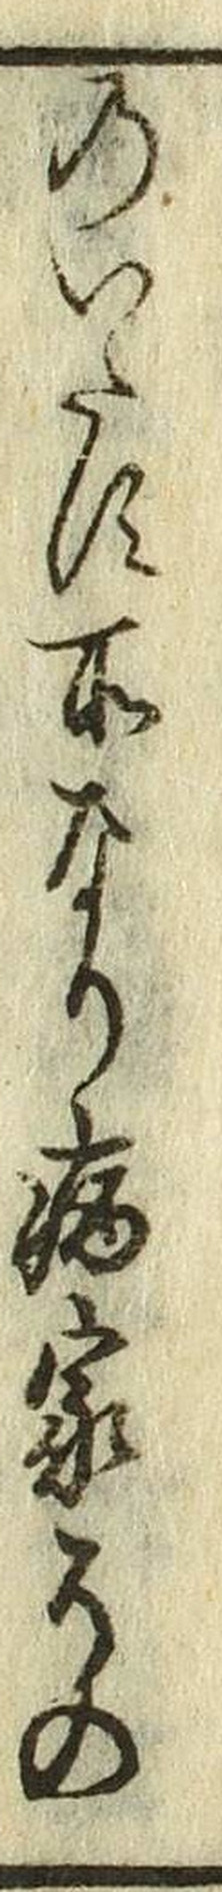のいたす所なり病家その
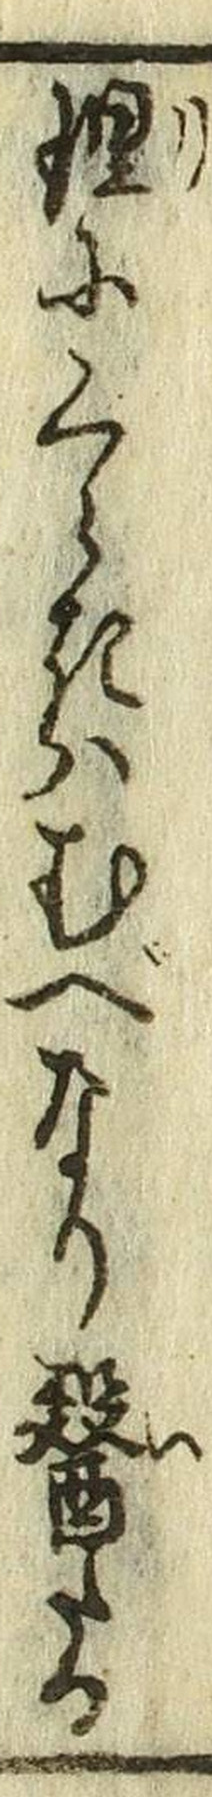理にくらきはむべなり医たる
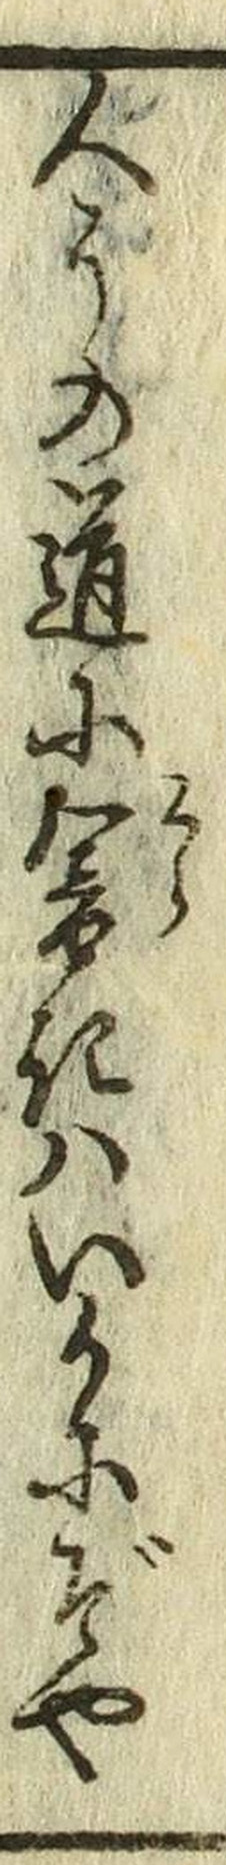人その道に闇きはいかにぞや
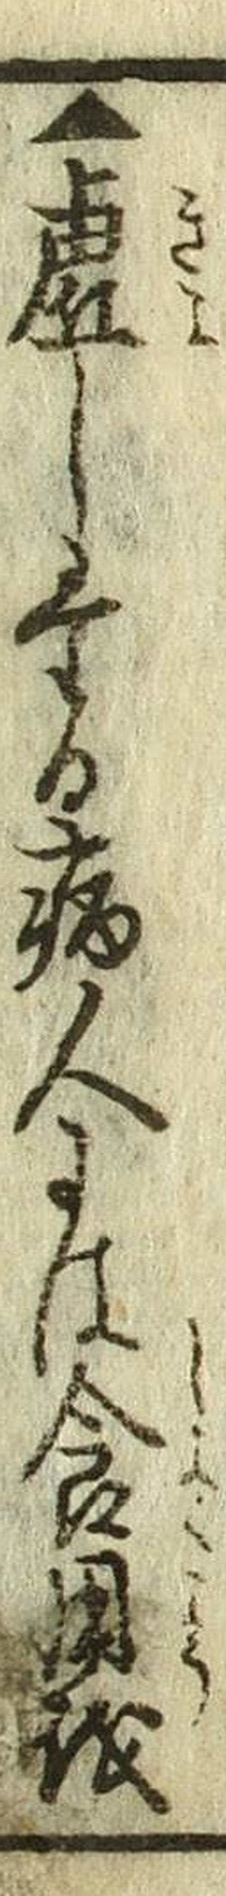▲虚したる病人には食用を
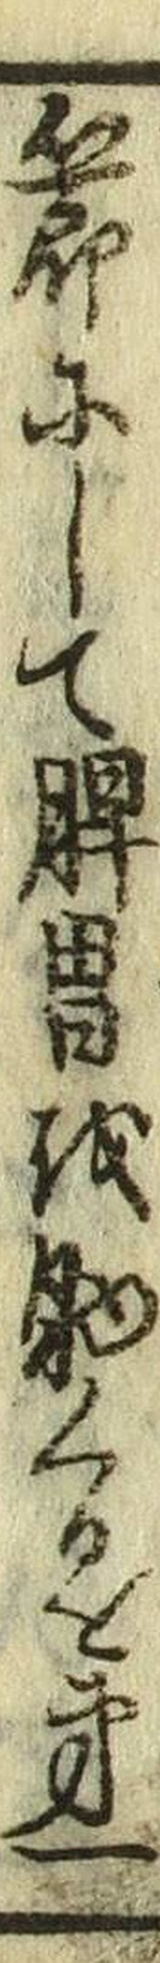節にして脾胃を助くるを第一

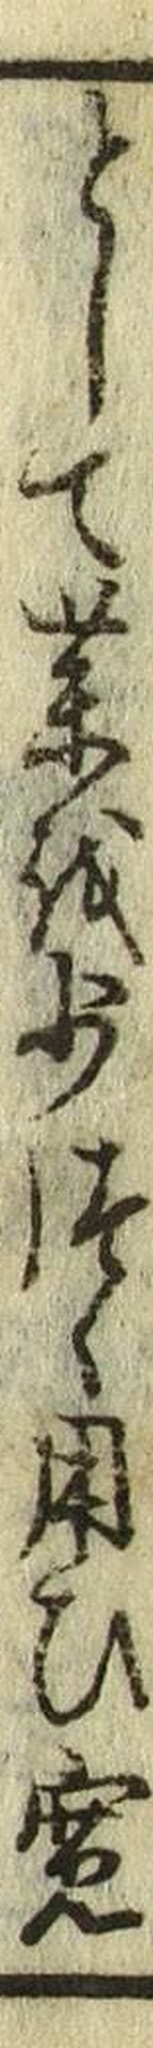として薬を少つゝ用ひ寛
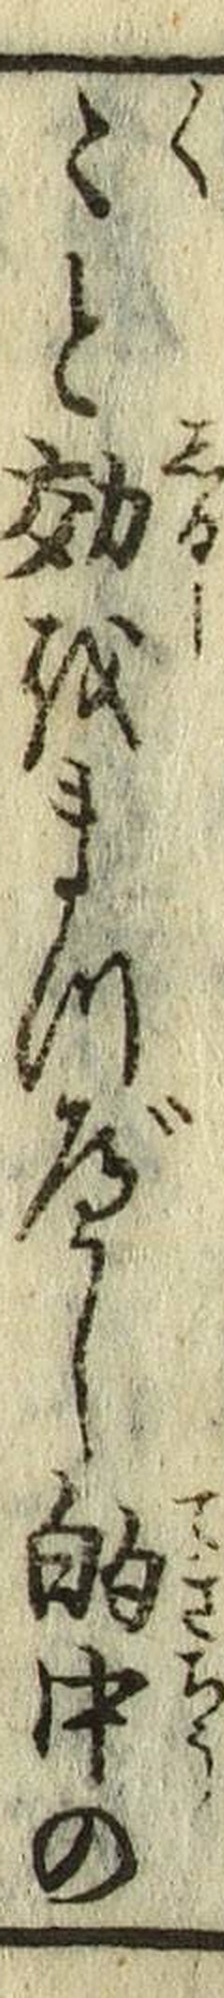々と効まつべし的中の
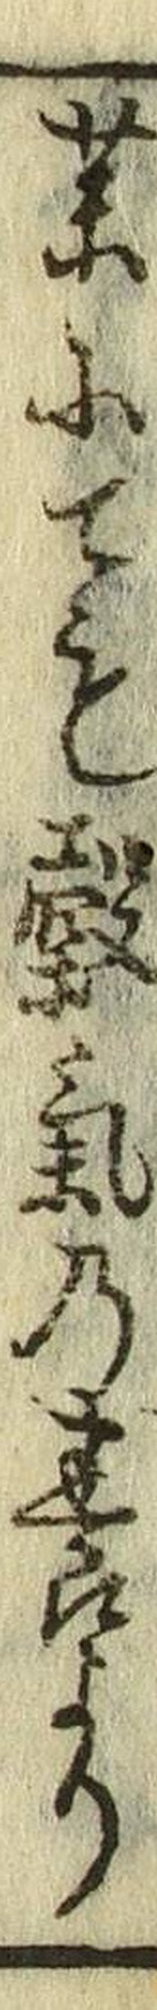薬にても穀気の養より
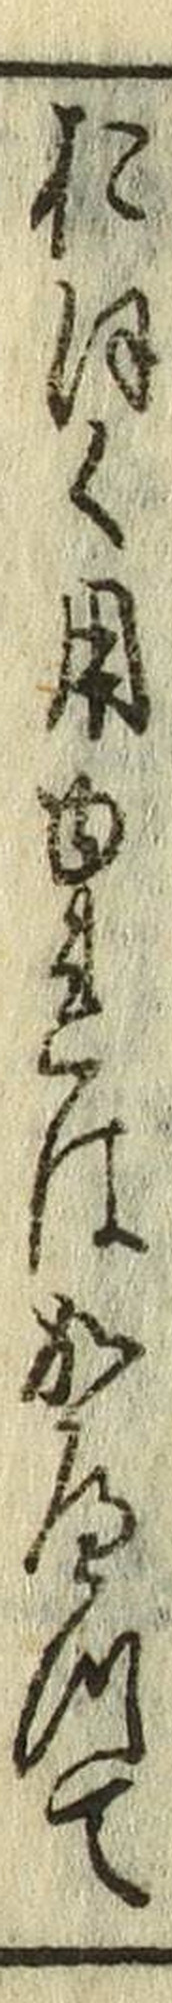おほく用ゆれはかへつて
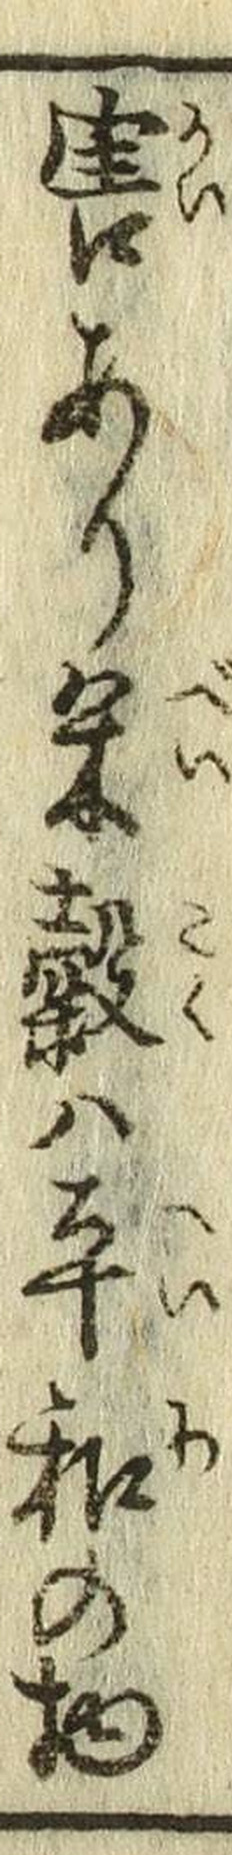害あり米穀は平和の物
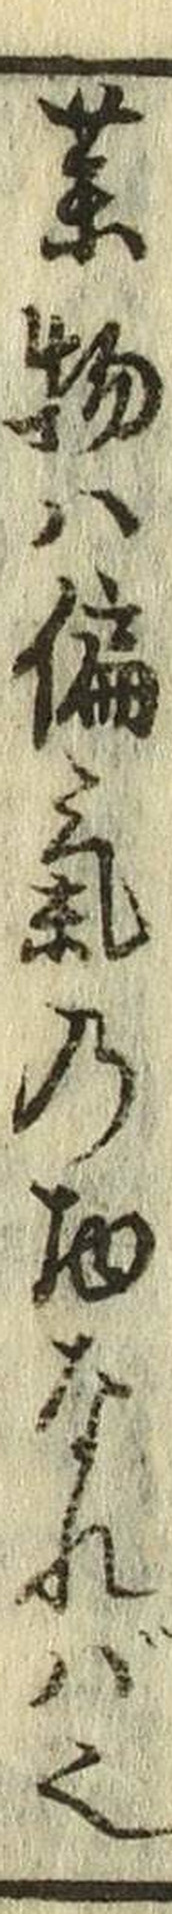薬物は偏気の物なれば也
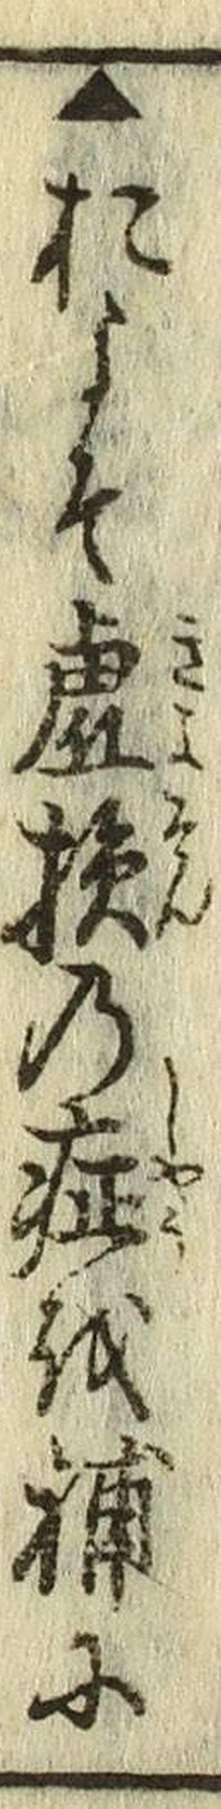▲およそ虚損の症を補に
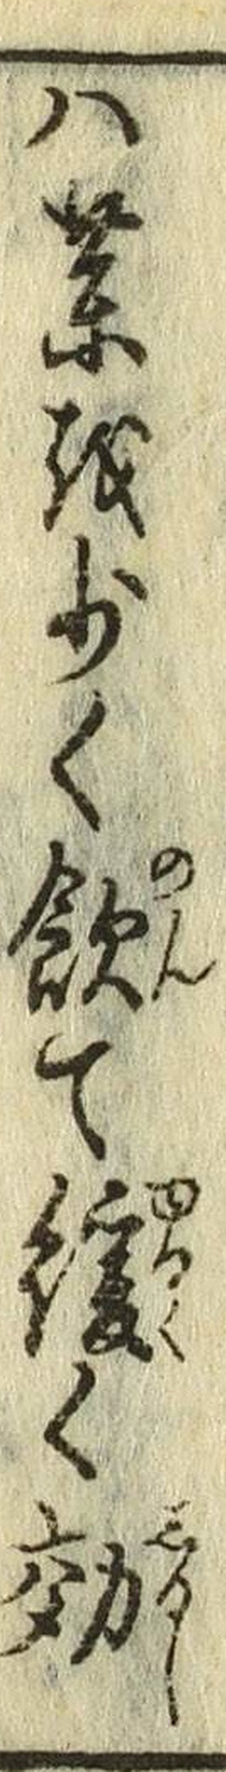は薬を少く飲て緩く效
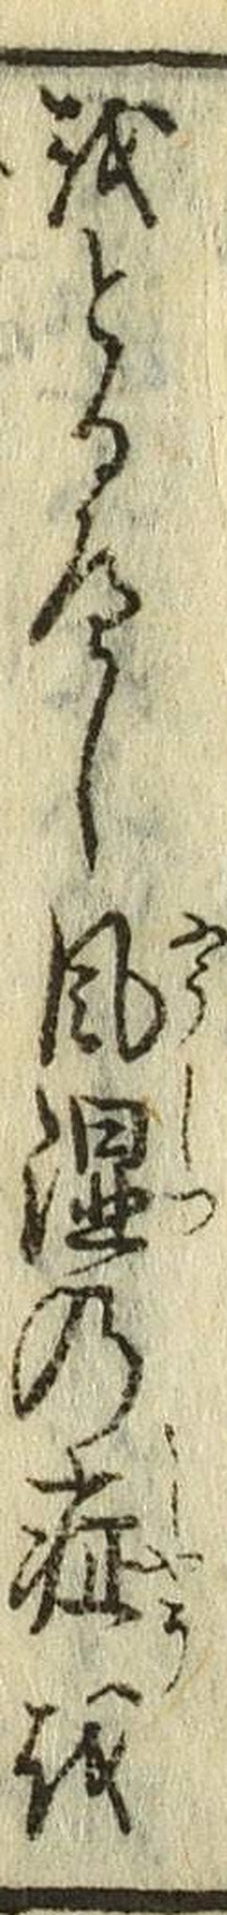をとるへし風湿の症を
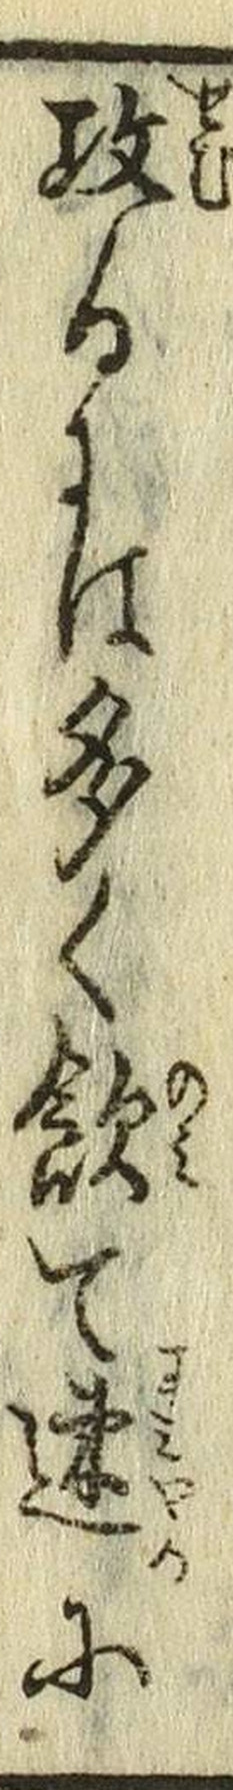攻るには多く飲て速に
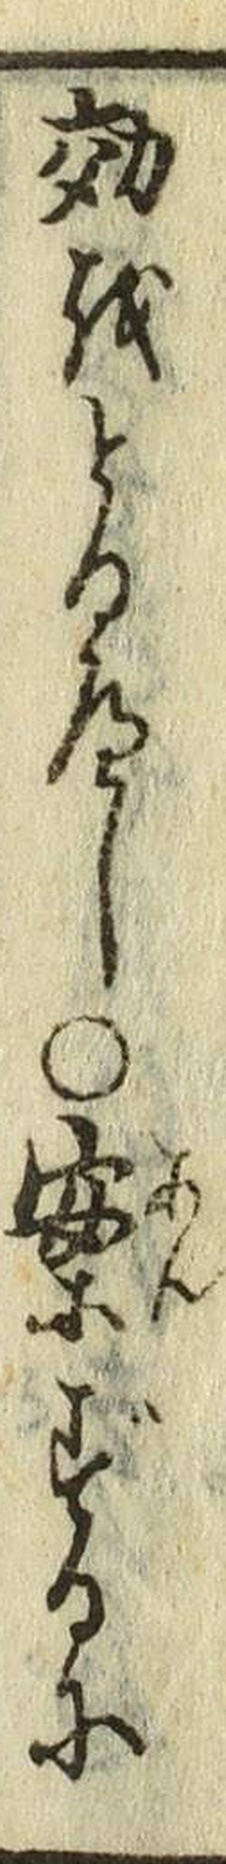効をとるへし○案ずるに
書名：居家養生記
